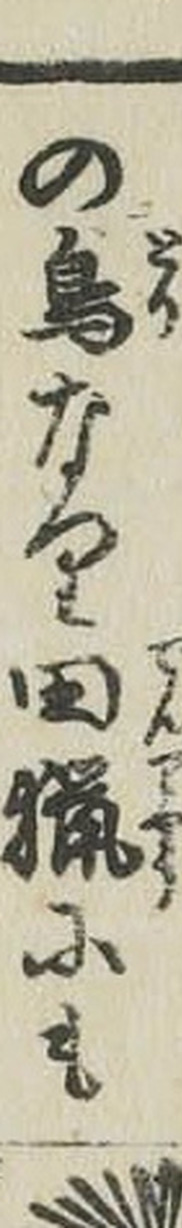の鳥なり田猟にも
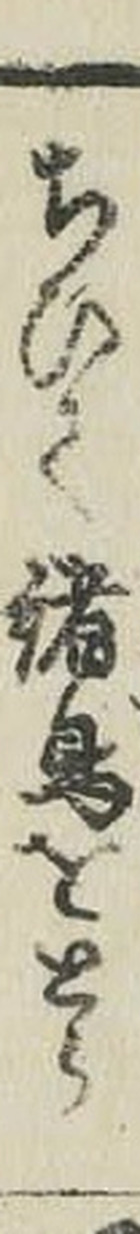ちひて諸鳥をとら
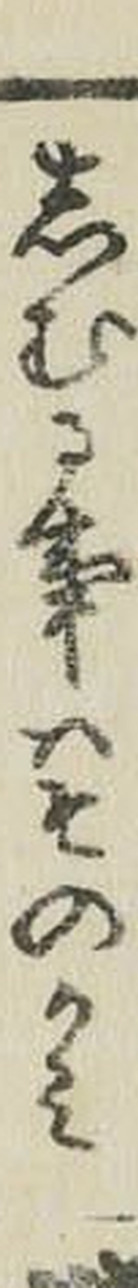しむる事はそのかみ
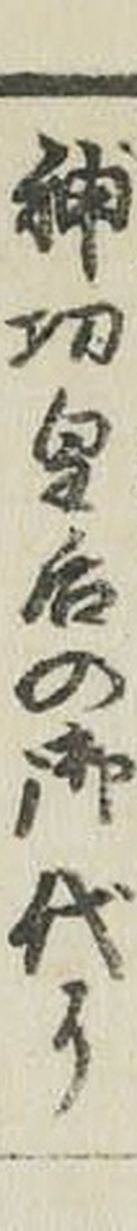神功皇后の御代に
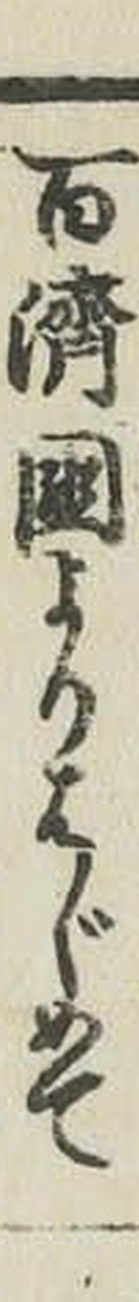百済国よりはじめて
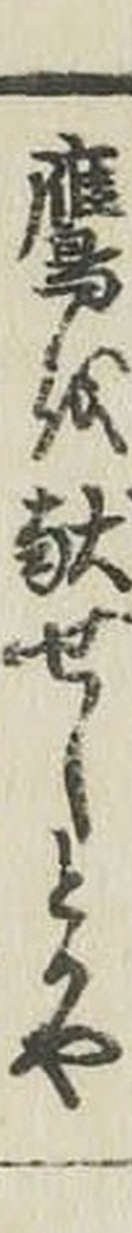鷹を献ぜしとかや
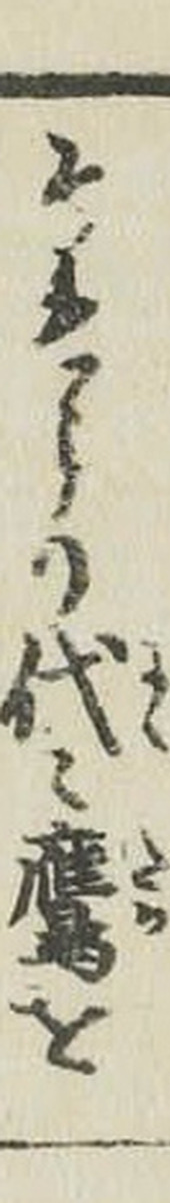それより代々鷹を
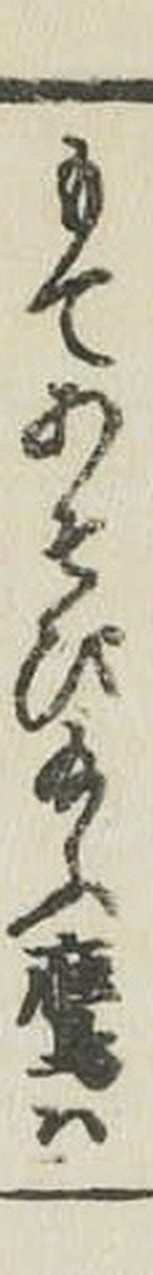もてあそび給ふ鷹は
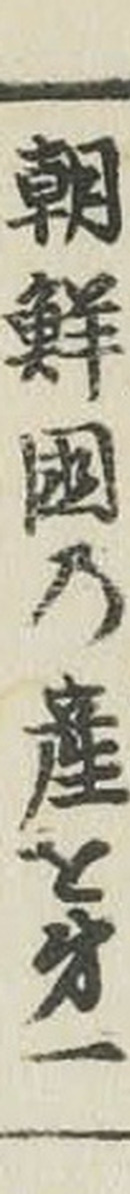朝鮮国の産を第一
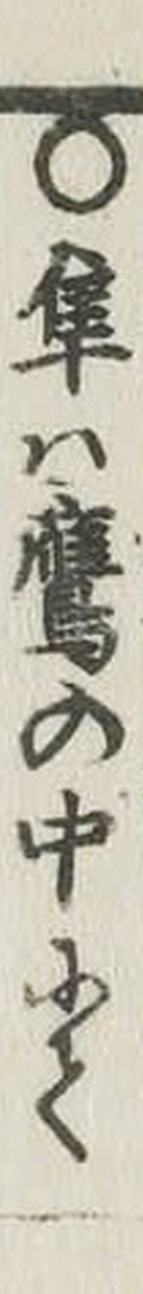○隼は鷹の中にて
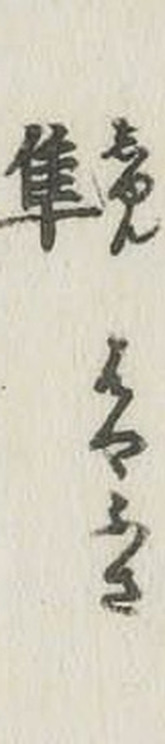隼はやふさ
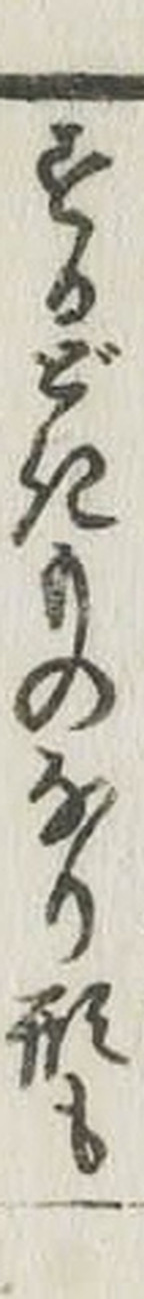するどきものなり形も
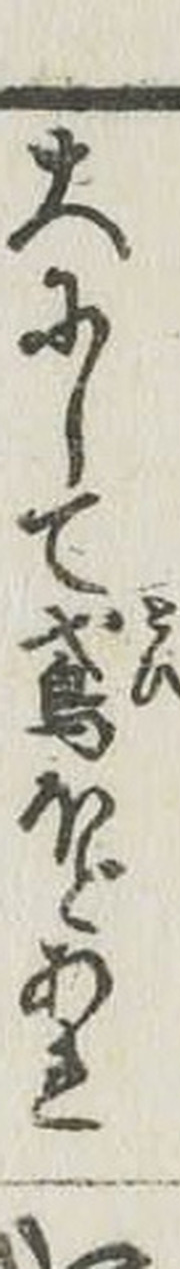大にして鳶ほどあれ
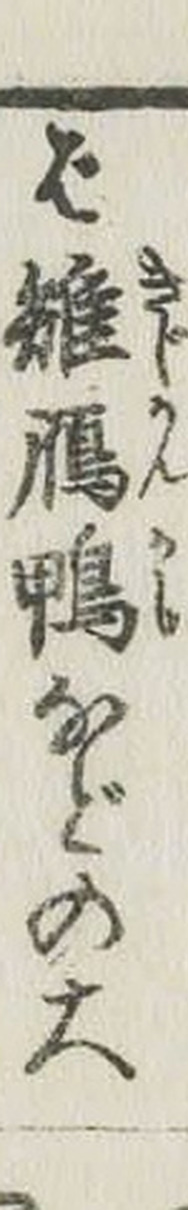ば雉鴈鴨などの大
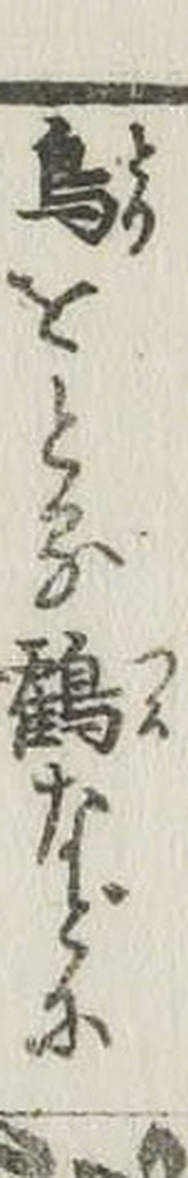鳥をとる鶴などに
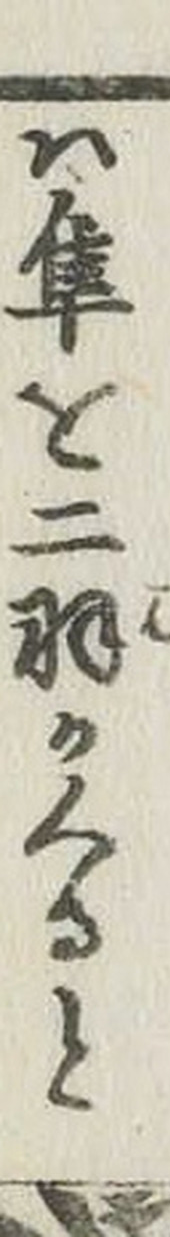は隼を二羽かくると
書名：増補頭書訓蒙図彙大成 10巻 6:巻之12-13
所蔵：東京学芸大学教育コンテンツアーカイブ
